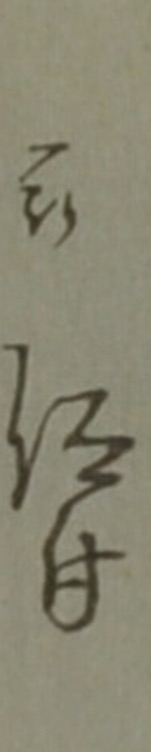被仰付
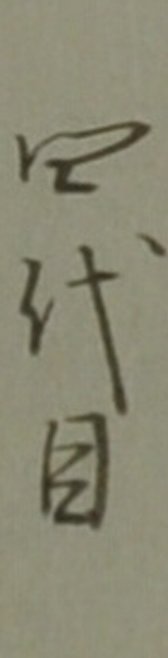四代目
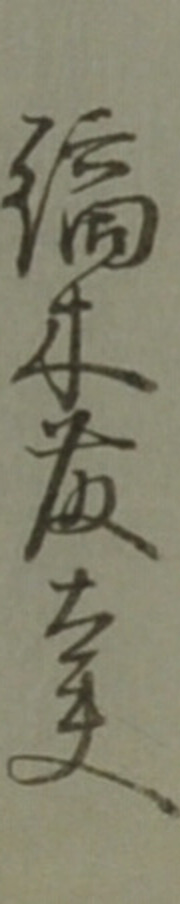鏑木藤太夫
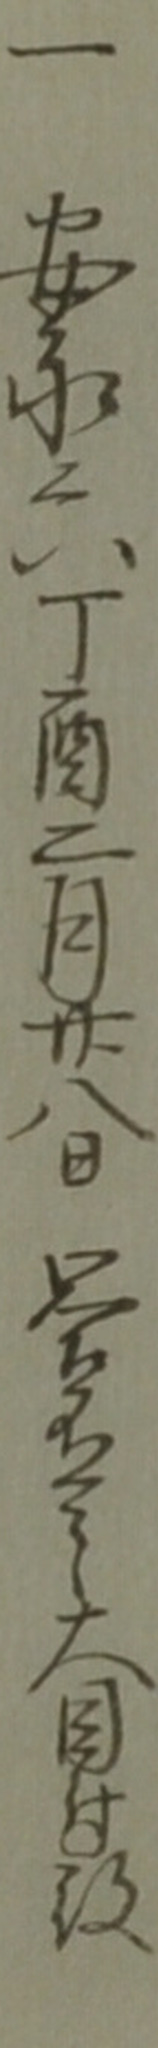一安永六丁酉二月廿八日思召有之大目付役
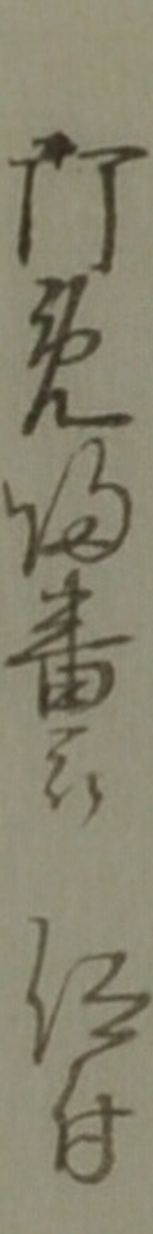御免帰番被仰付
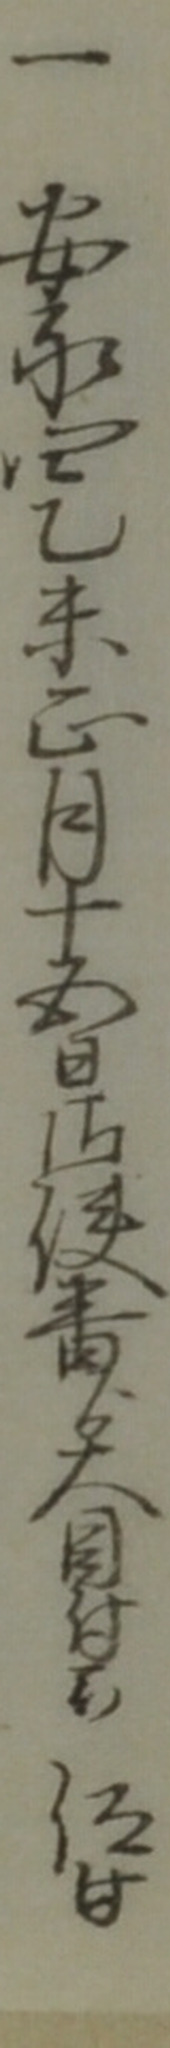一安永四乙未正月十五日御使番ゟ大目付被仰付
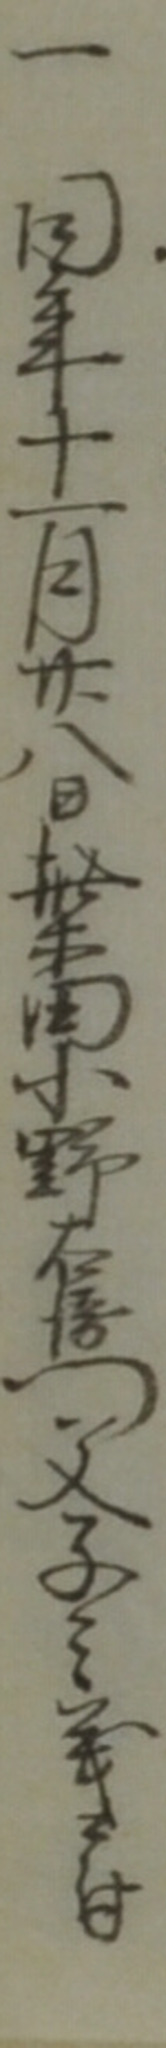一同年十一月廿八日柴田小野右衛門父子之義ニ付
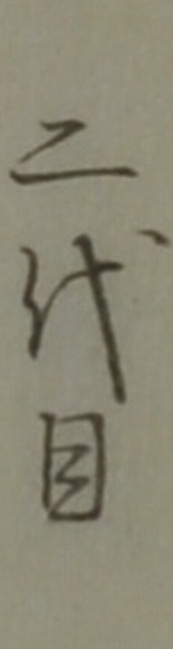二代目
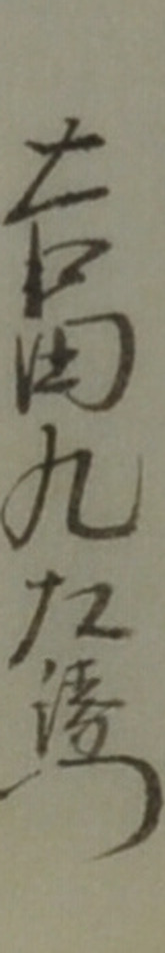吉田九左衛門
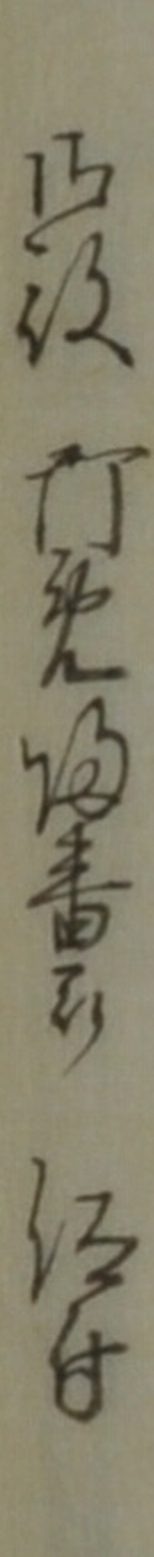御役御免帰番被仰付
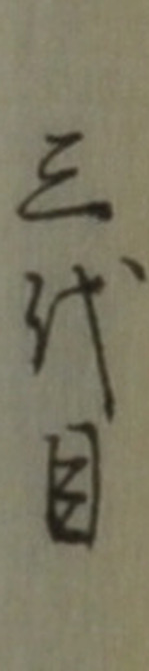三代目
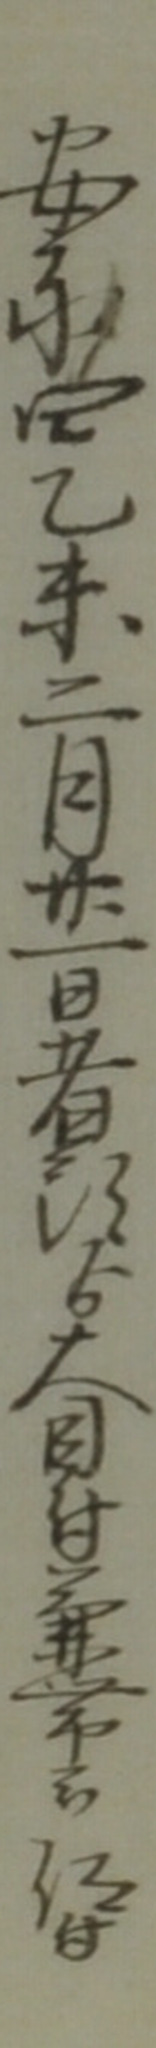一安永四乙未二月廿一日者頭ゟ大目付兼帯被仰付
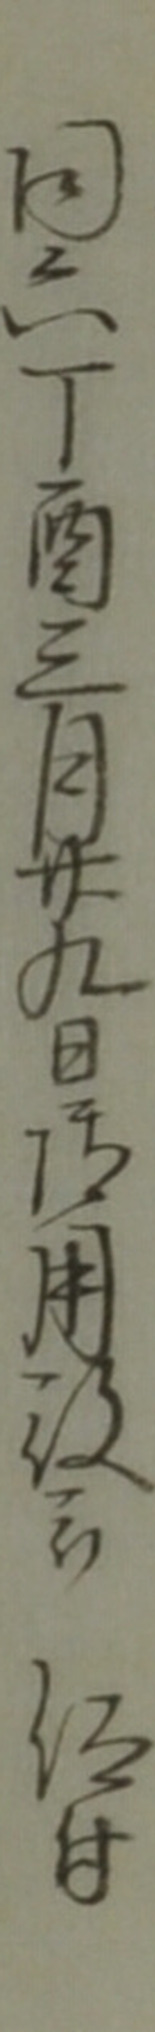一同六丁酉三月廿九日御用役被仰付
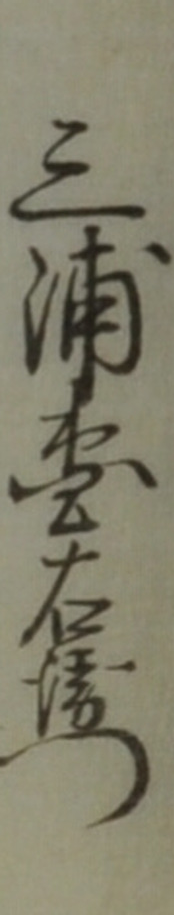三浦団右衛門
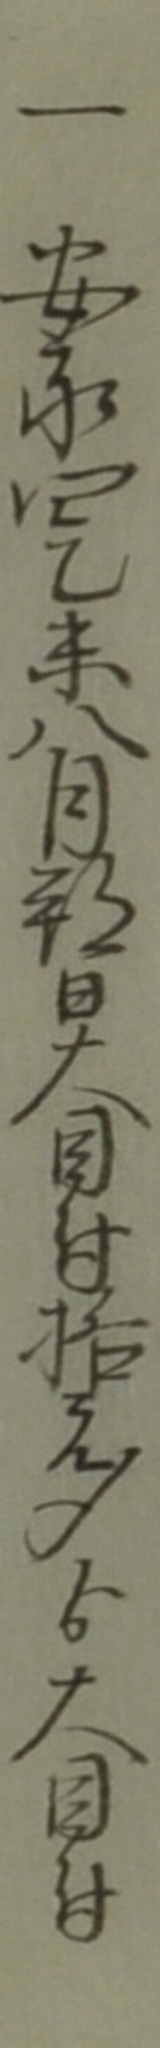一安永四乙未八月朔日大目付格元〆ゟ大目付
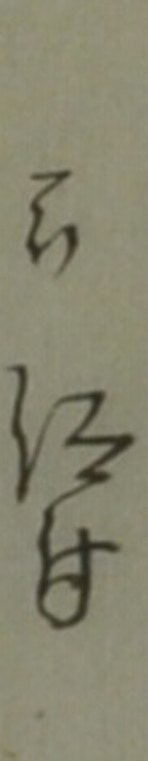被仰付
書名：諸御役代々録（三）
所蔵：伊那市立高遠町図書館・合同会社AMANE
